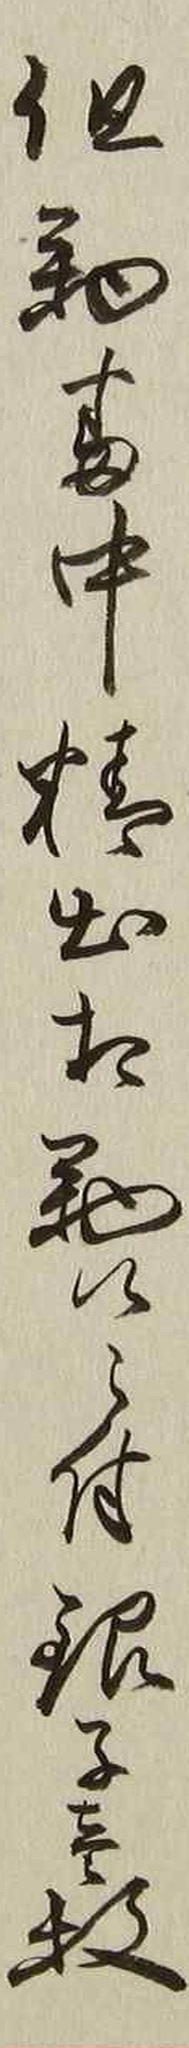但勤番中精出相勤候ニ付銀子壱枚
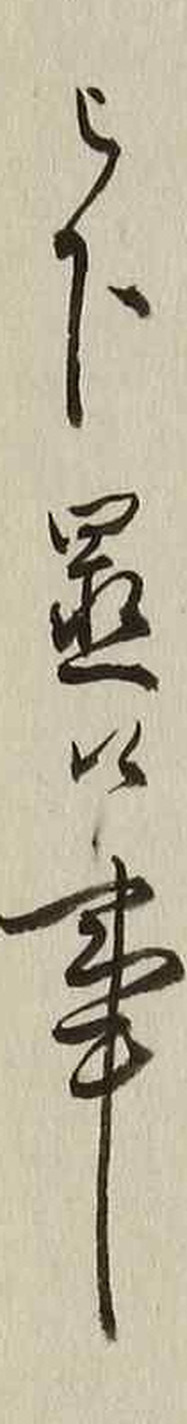被下置候事
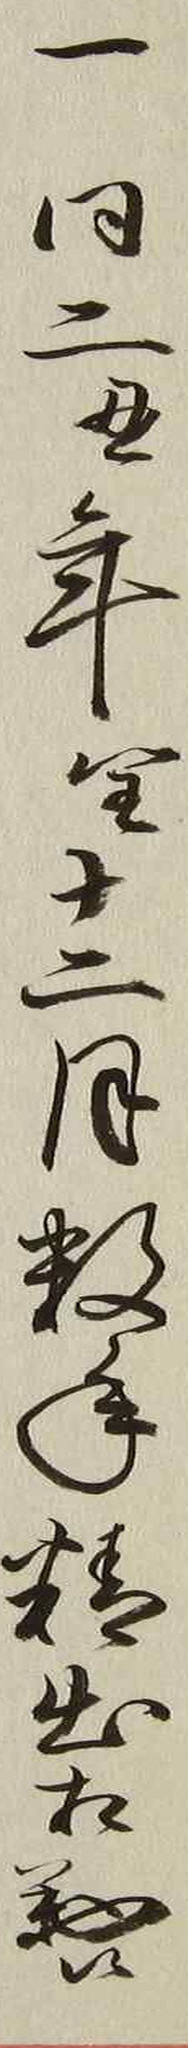一同二丑年閏十二月数年精出相勤候
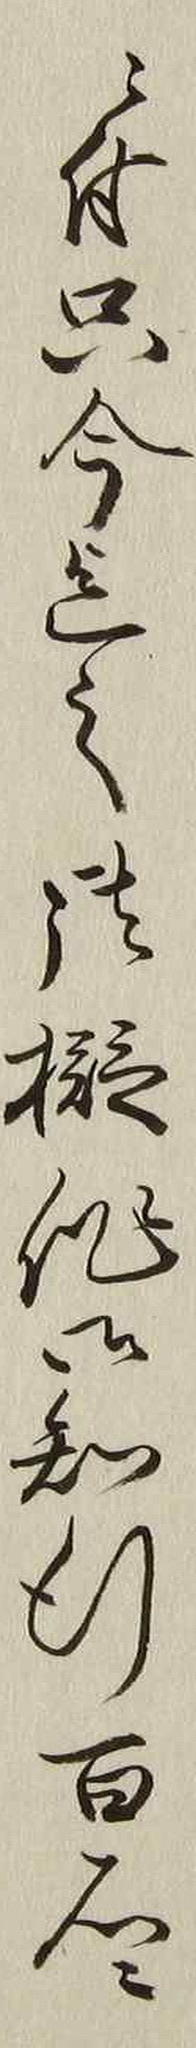ニ付只今迄之御擬作御知行百石ニ
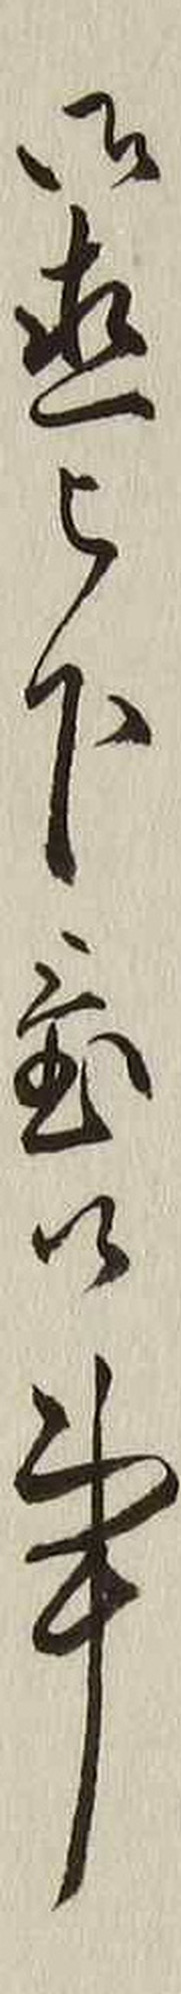御直被下置候事
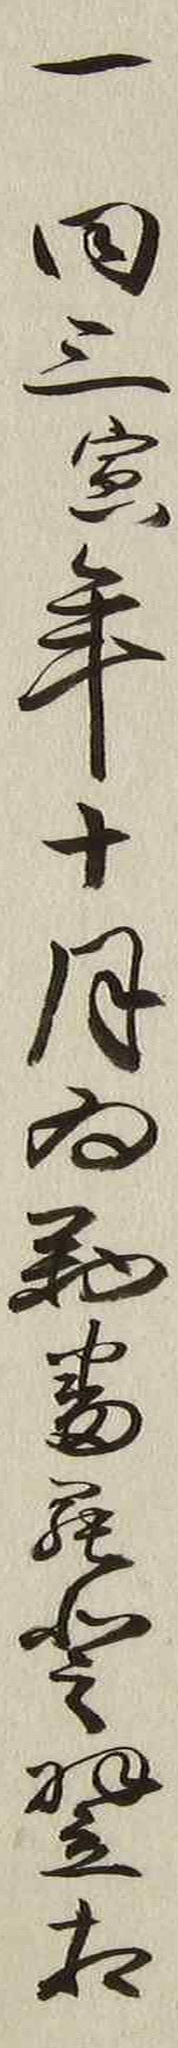一同三寅年十月為勤番罷登翌相
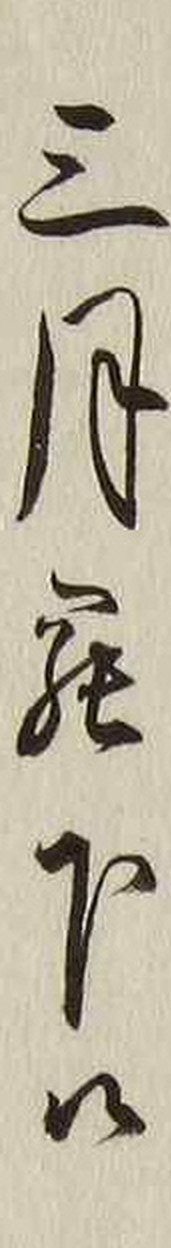三月罷下候
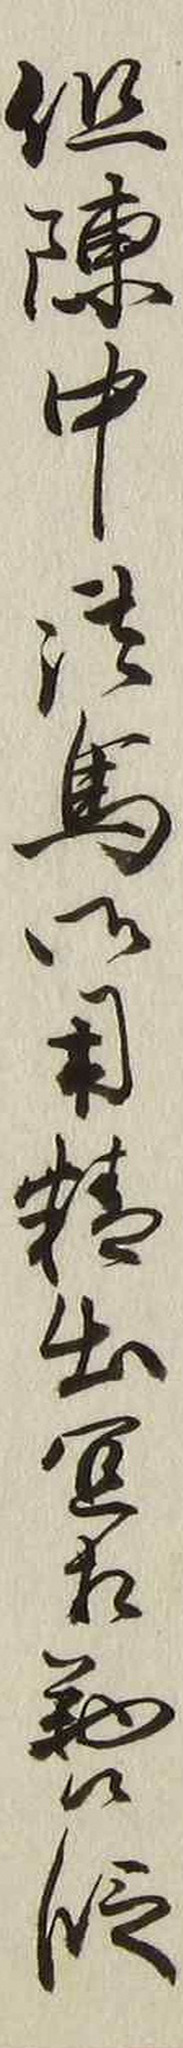但陳中御馬御用精出宜相勤候段
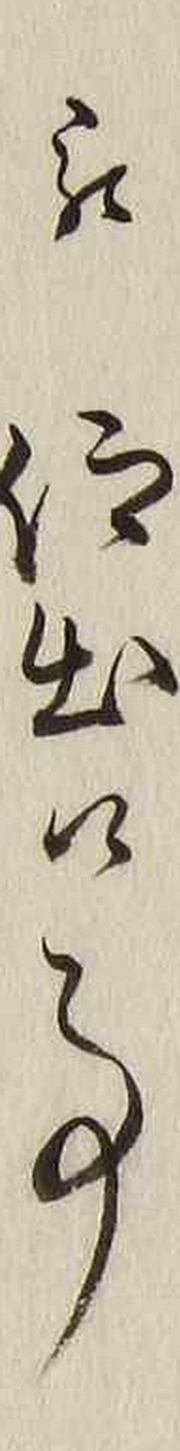被仰出候事
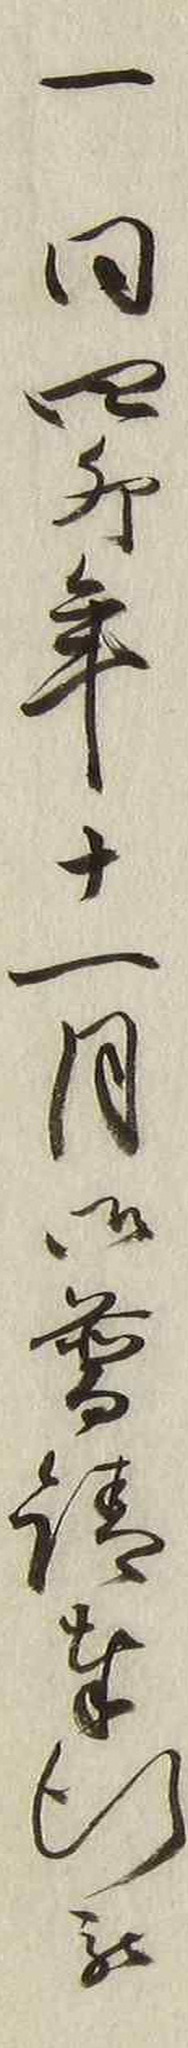一同四卯年十一月御普請奉行被
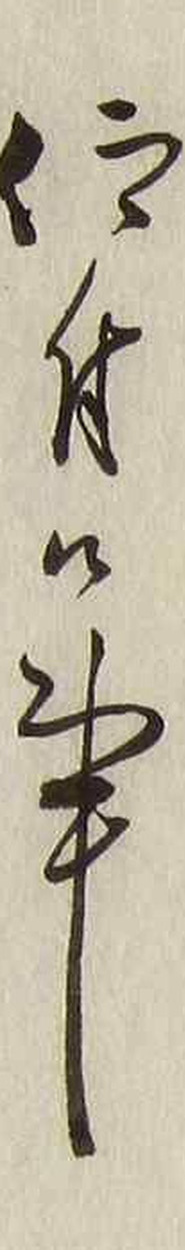仰付候事
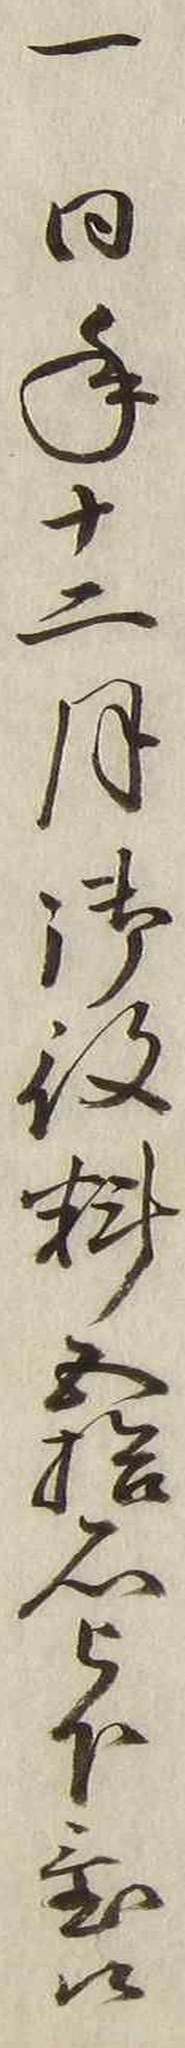一同年十二月御役料五拾石被下置候

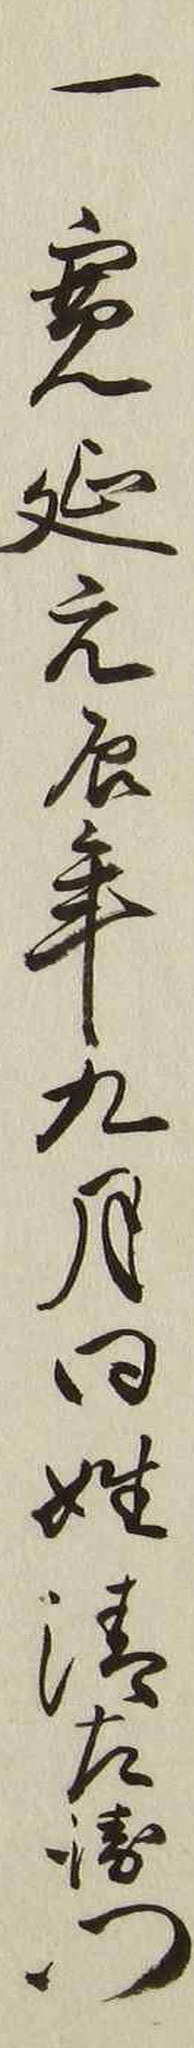一寛延元辰年九月同姓清左衛門
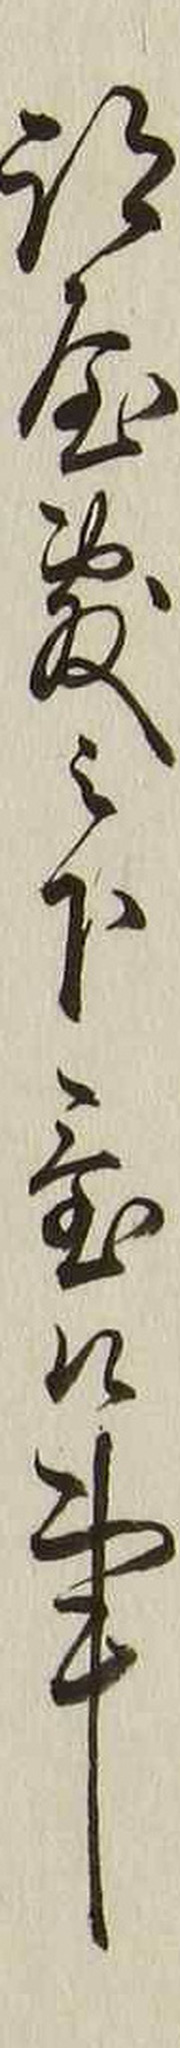跡屋敷被下置候事
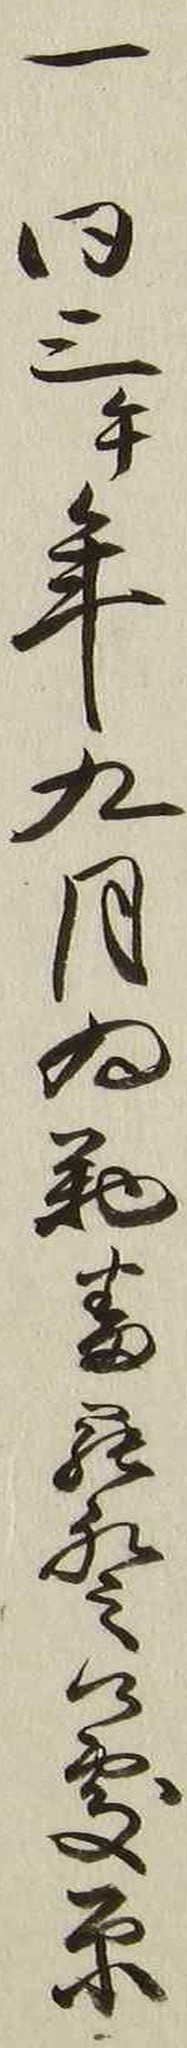一同三午年九月為勤番罷登候処原
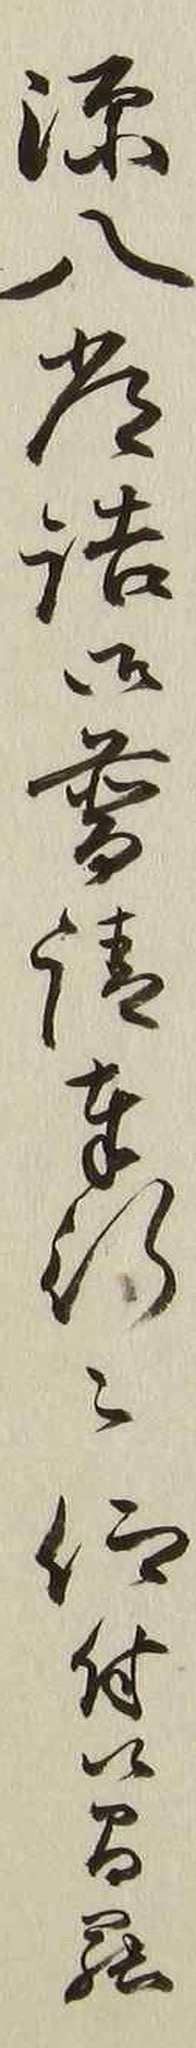源八常詰御普請奉行被仰付候間罷
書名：諸士系譜　巻之21　い之部21
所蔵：会津若松市立会津図書館
